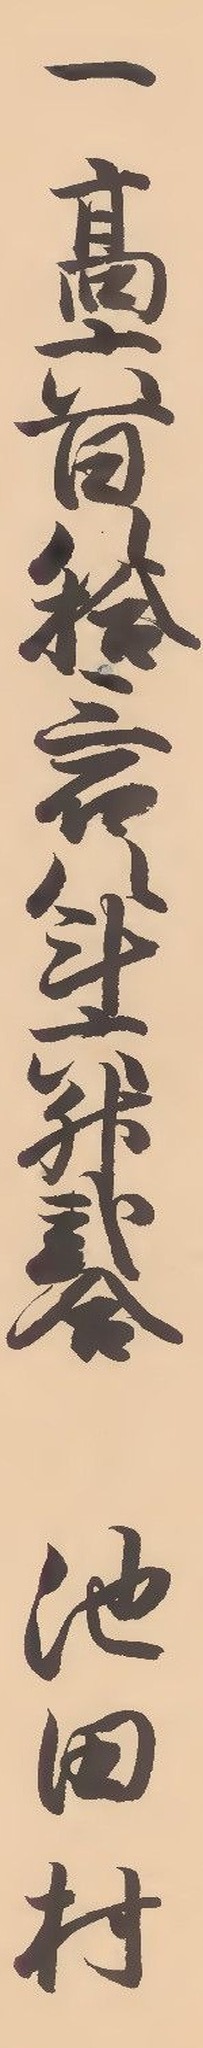一高六百八拾三石八斗六升弐合池田村
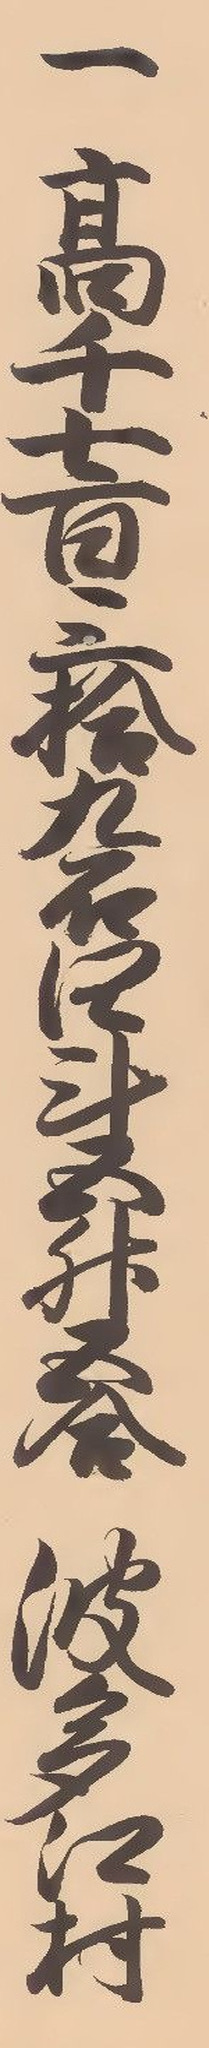一高千七百三拾九石四斗五升五合波多江村
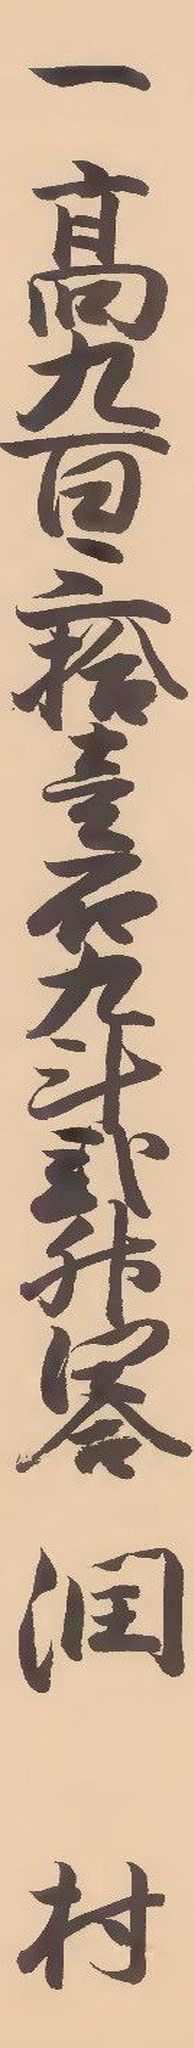一高九百三拾壱石九斗弐升四合潤村
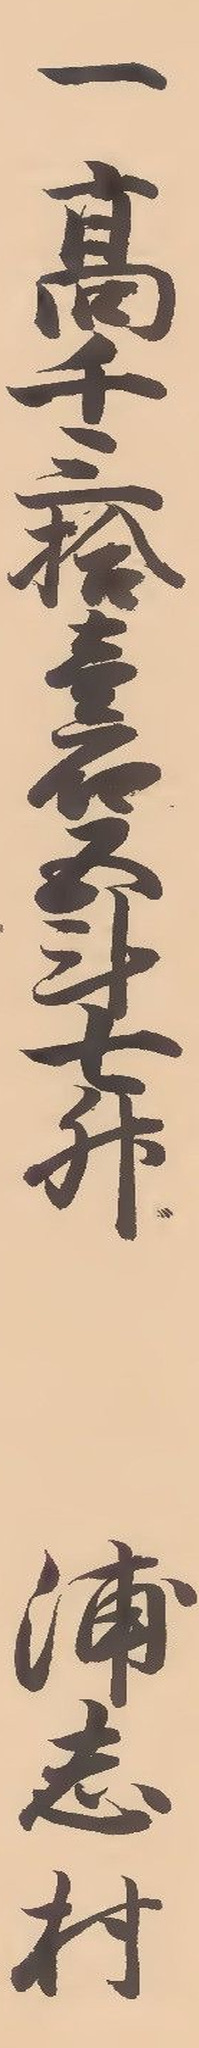一高千三拾壱石五斗七升浦志村
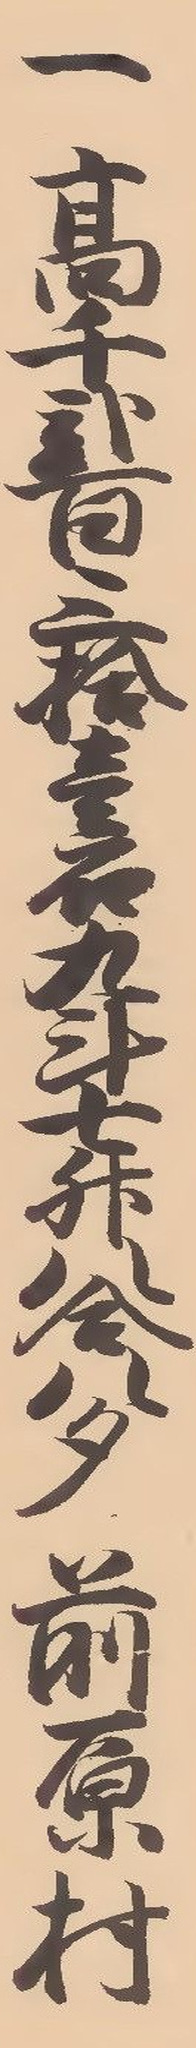一高千弐百三拾壱石九斗七升八合八勺前原村

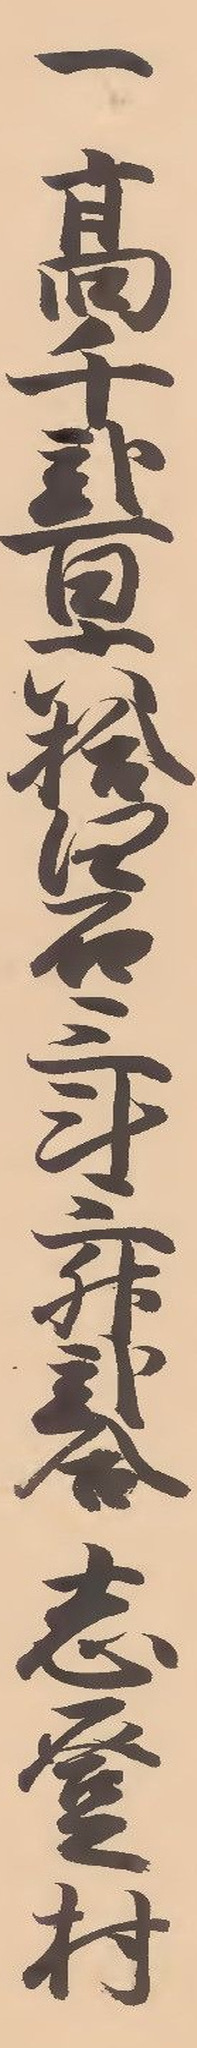一高千弐百六拾四石三斗三升弐合志登村
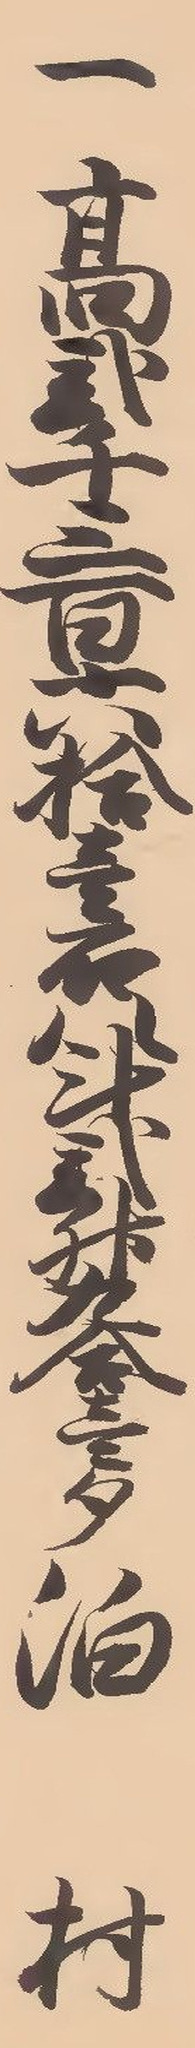一高弐千三百六拾壱石八斗弐升九合壱勺泊村
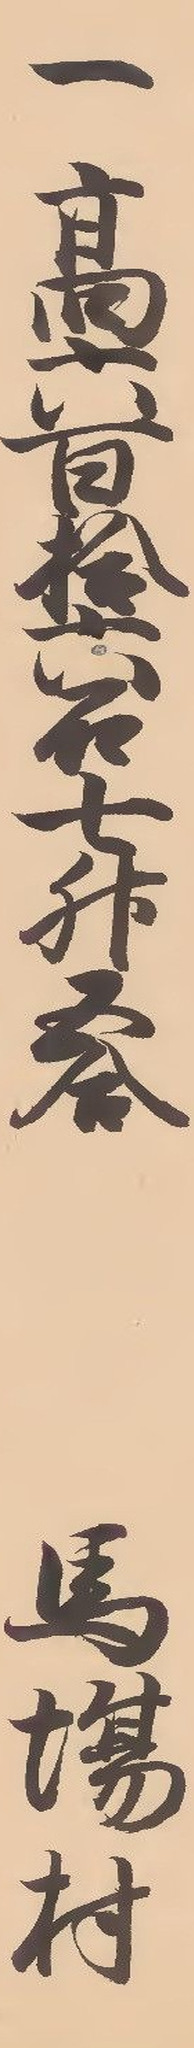一高六百拾六石七升五合馬場村
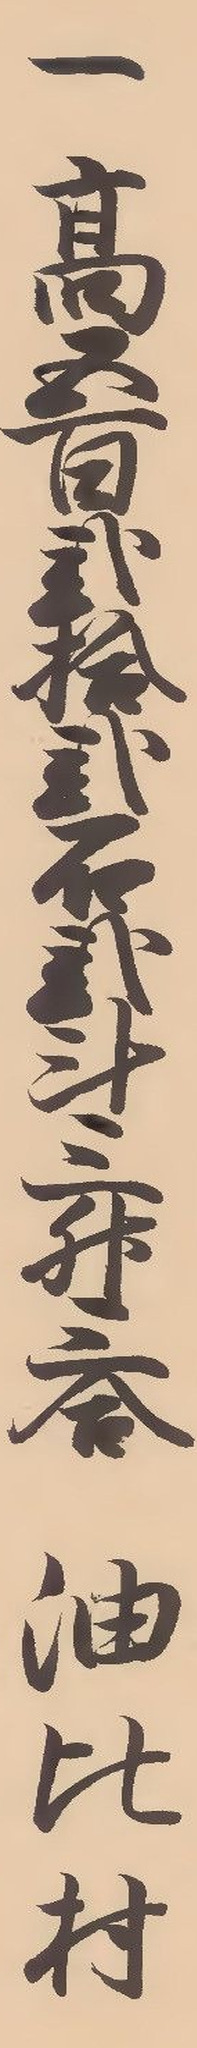一高五百弐拾弐石弐斗三升三合油比村
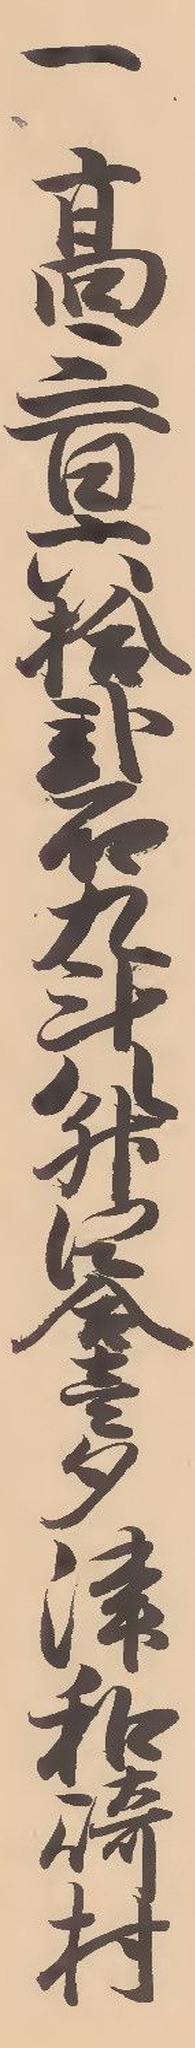一高三百六拾弐石九斗八升四合壱勺津和崎村

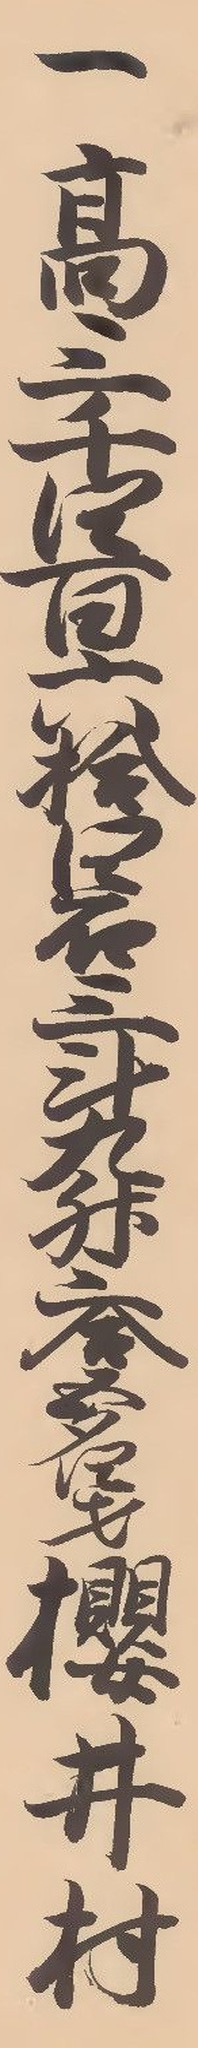一高三千四百六拾四石三斗九升三合五勺四才桜井村
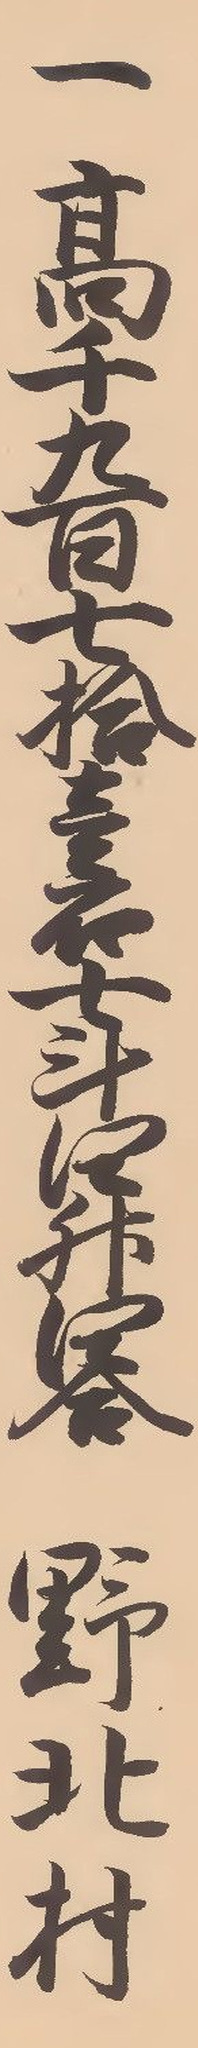一高千九百七拾壱石七斗四升四合野北村
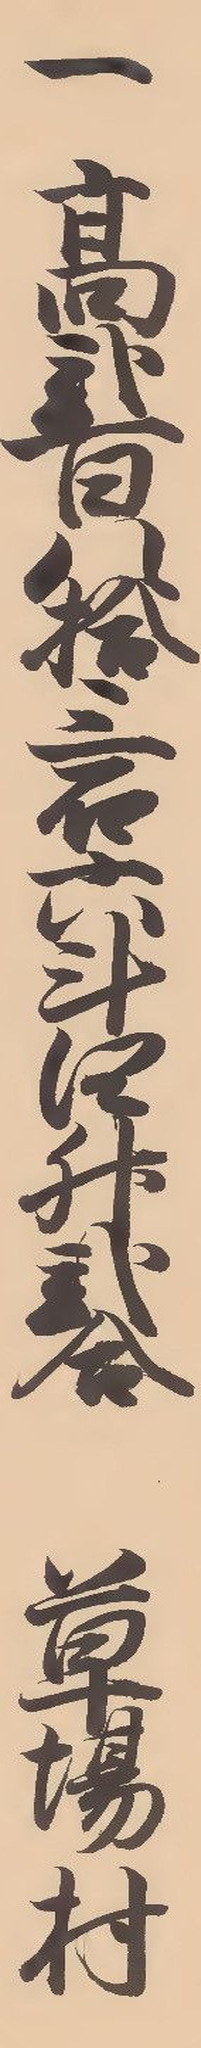一高弐百八拾三石六斗四升弐合草場村
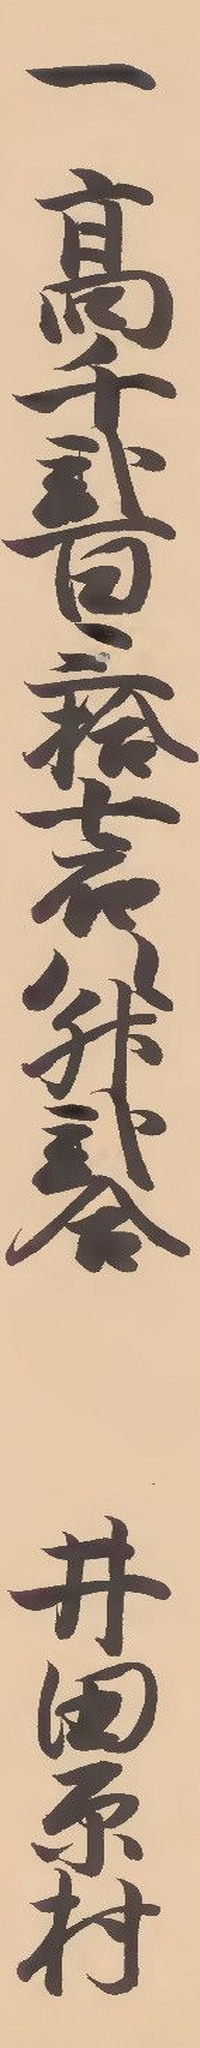一高千弐百三拾七石八升弐合井田原村
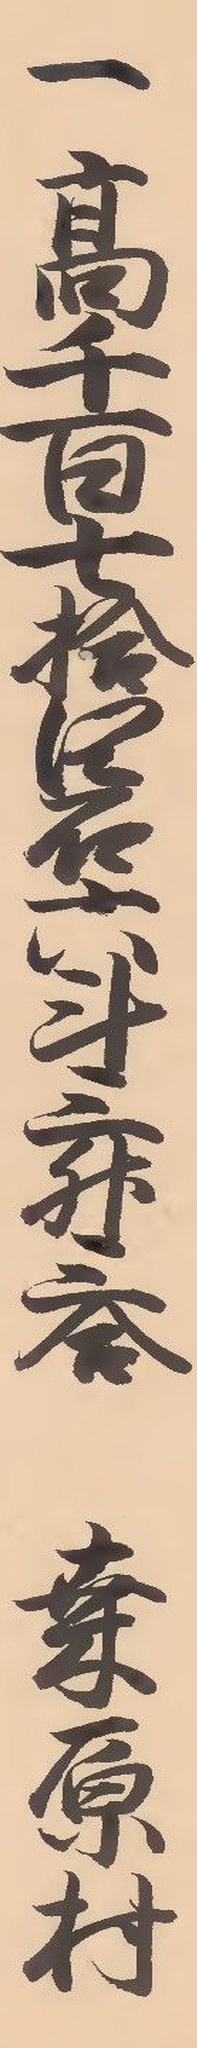一高千百七拾四石六斗三升三合桑原村
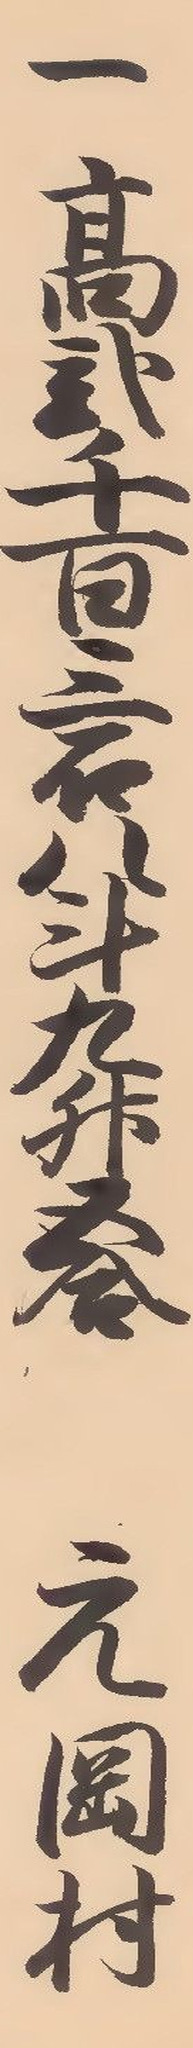一高弐千百三石八斗九升五合元岡村
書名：筑前国郷帳
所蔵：国立公文書館 National Archives of Japan
